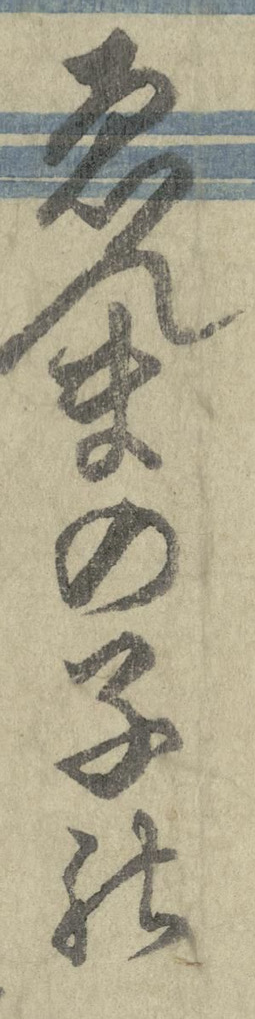ゑんまの子の
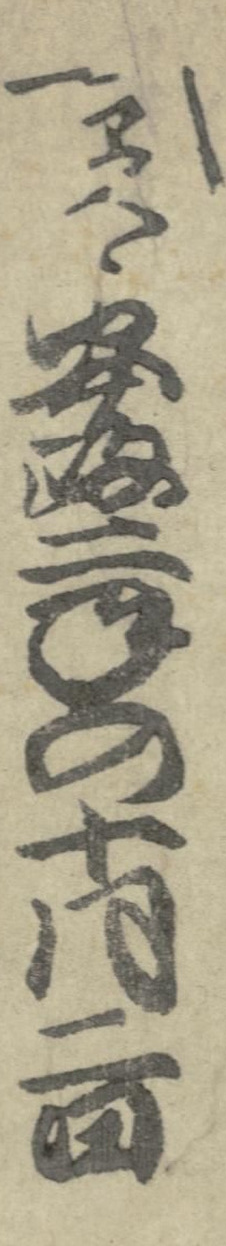〽ヱヘヽ安政二年の十月二日
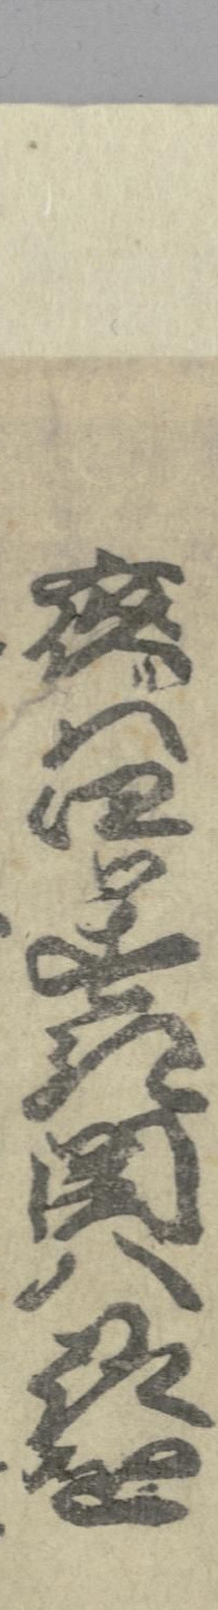夜ルは四つすき関八州を
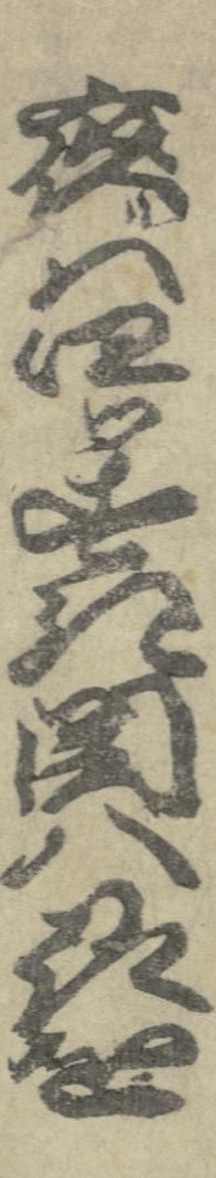夜ルは四つすき関八州を
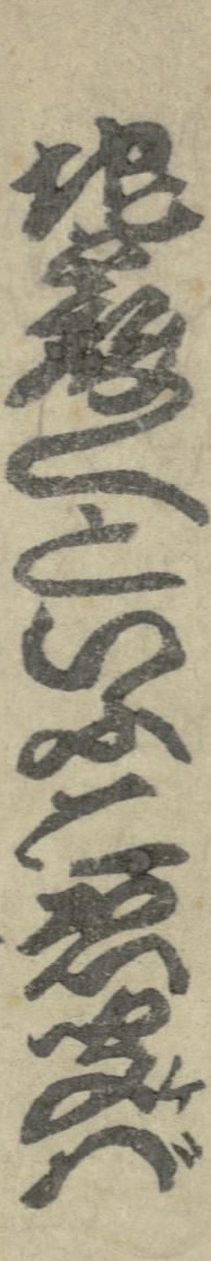地震〳〵といふこゑ聞ケば
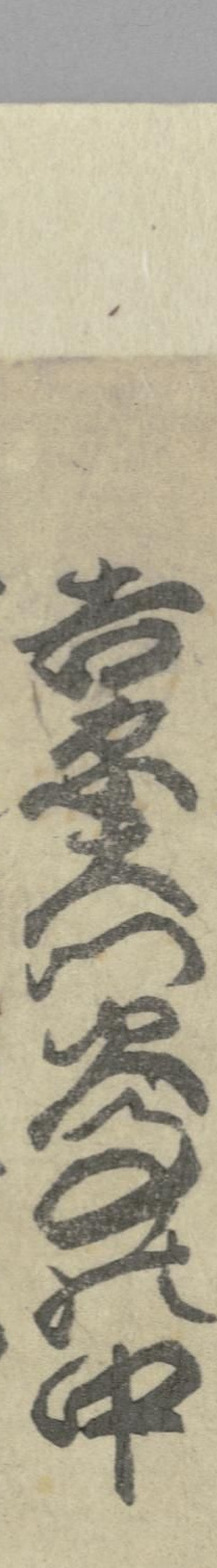吉原大門火事の中
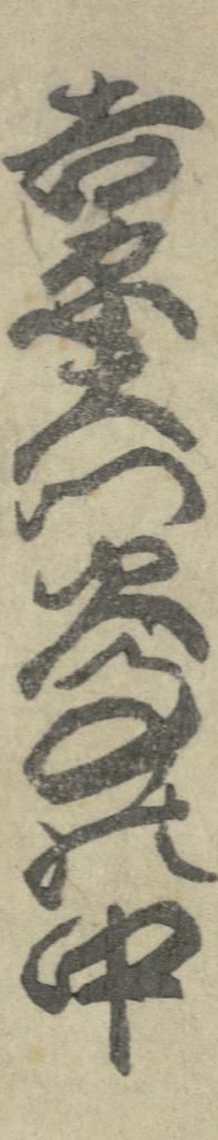吉原大門火事の中
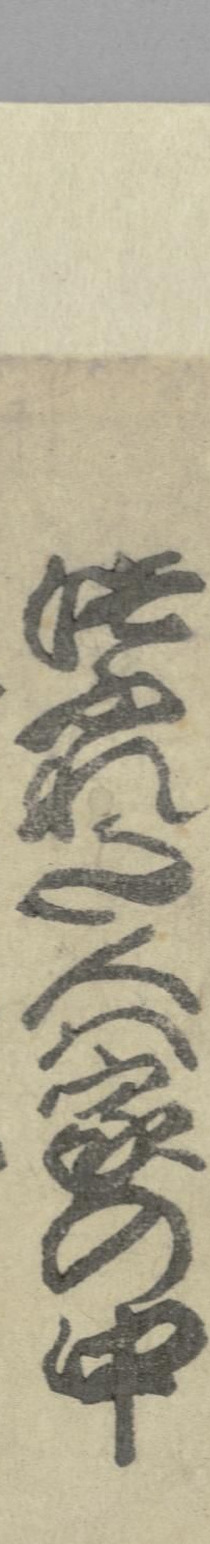つふれた人は家の中
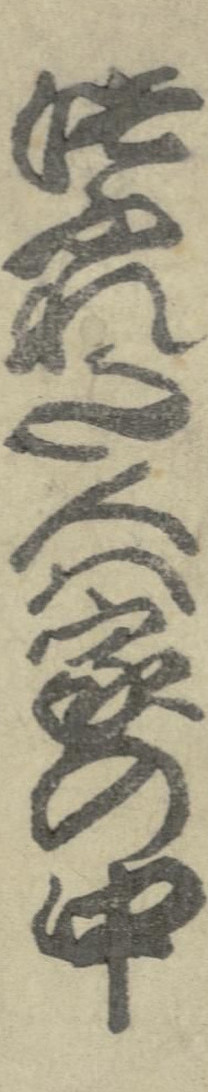つふれた人は家の中
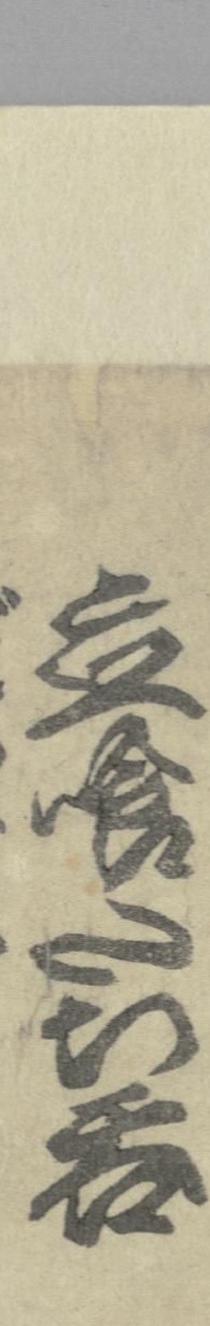立喰たち呑
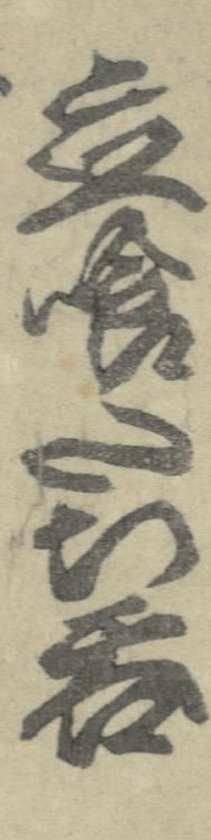立喰たち呑
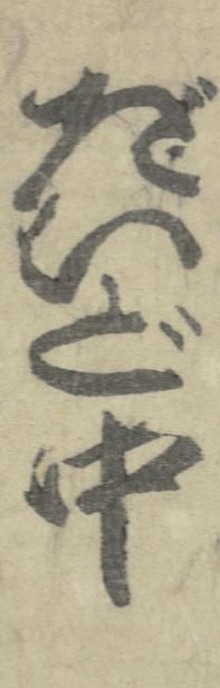だいど中
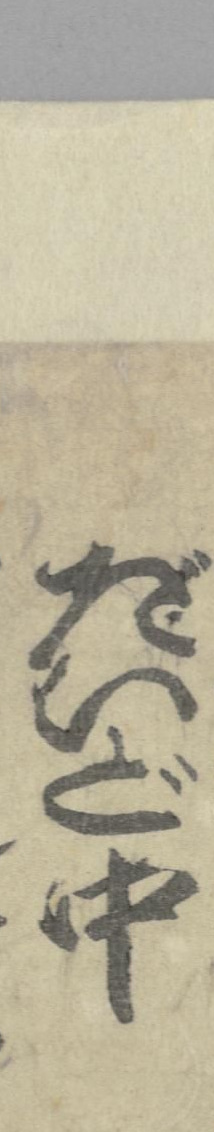だいど中
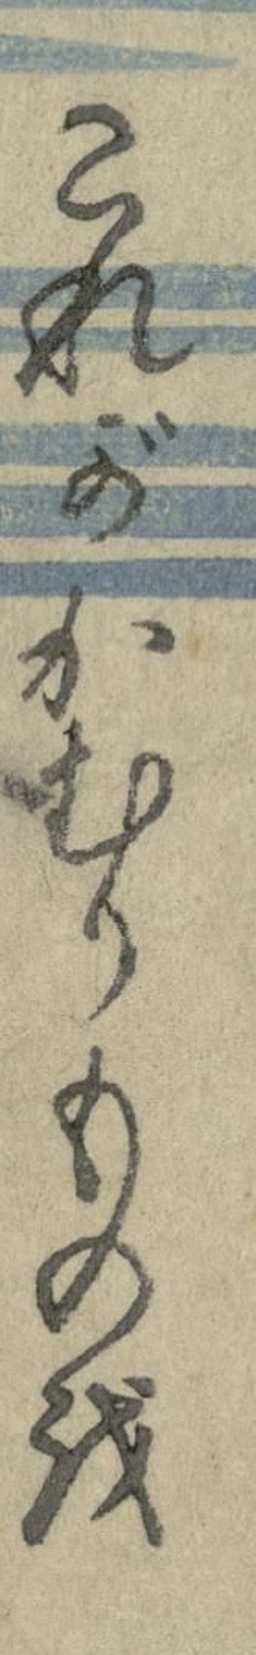これがかむりものを
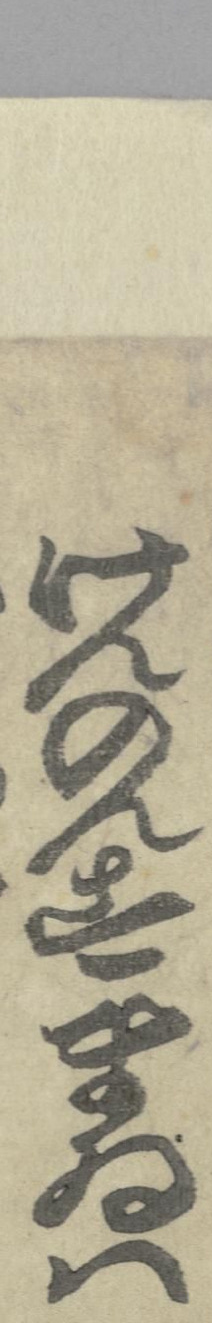けんのんすまゐは
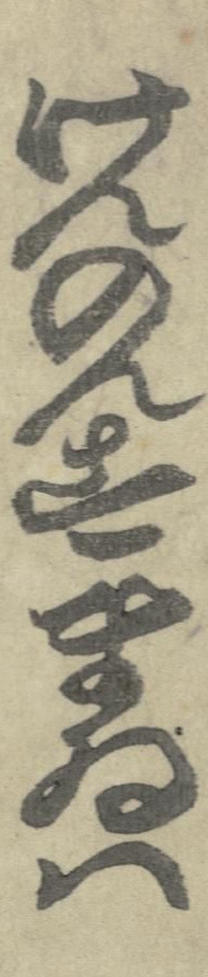けんのんすまゐは
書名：ゑんまの子のわけ
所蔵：東京大学地震研究所図書室 Earthquake Research Institute Library, The University of Tokyo, JAPAN
